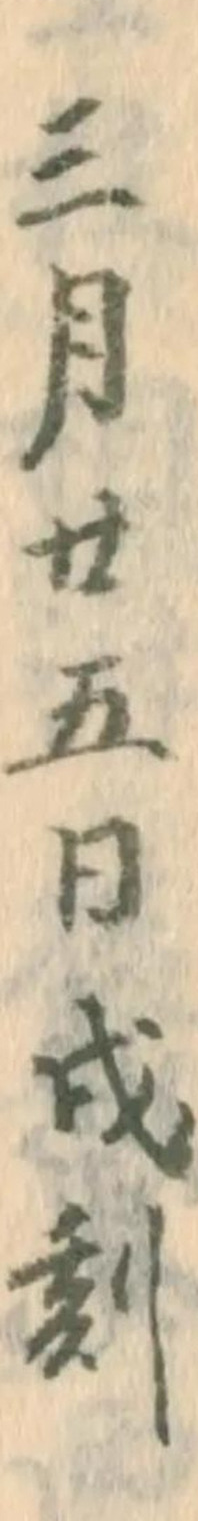三月廿五日戌刻
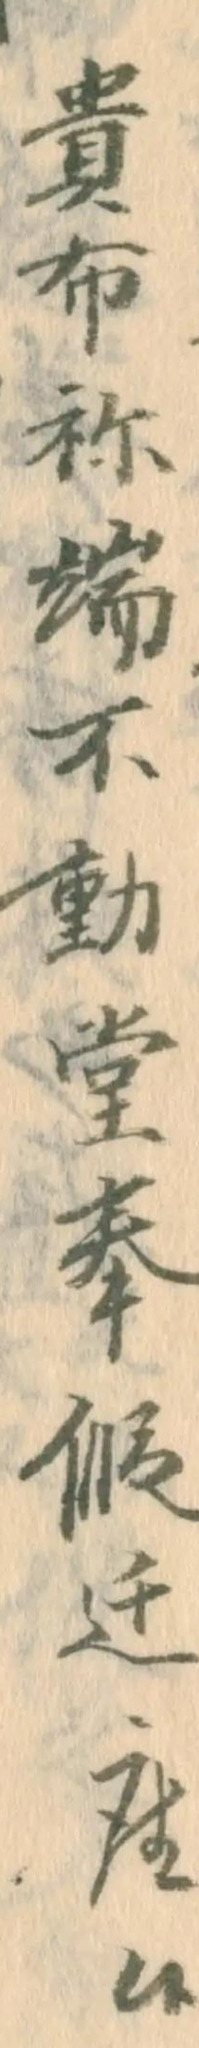貴布祢端不動堂奉仮迁座候
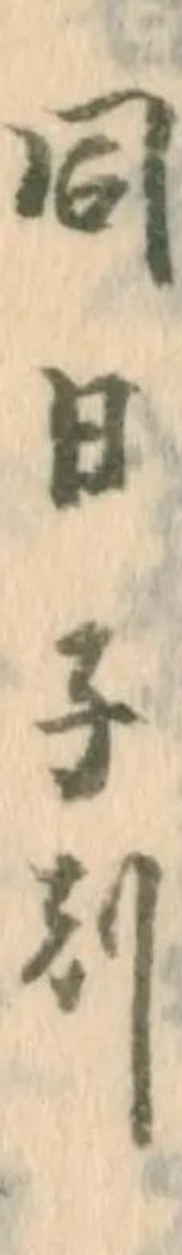同日子刻
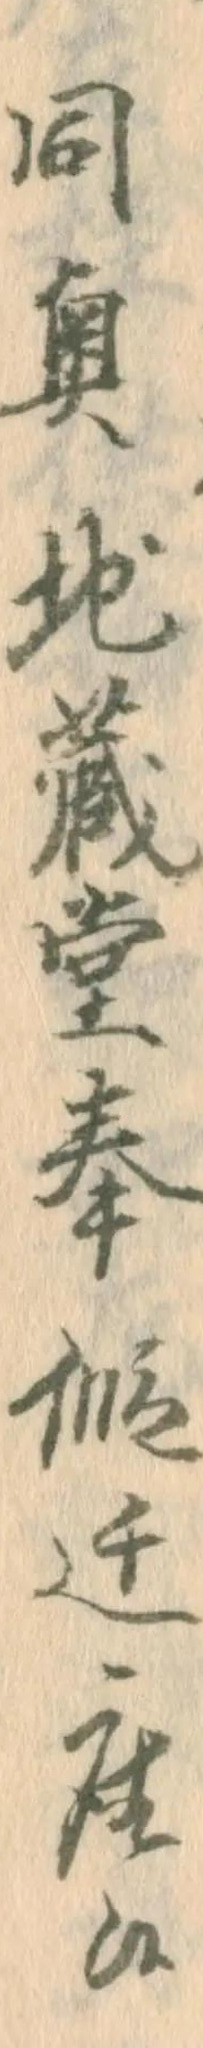同奥地蔵堂奉仮迁座候
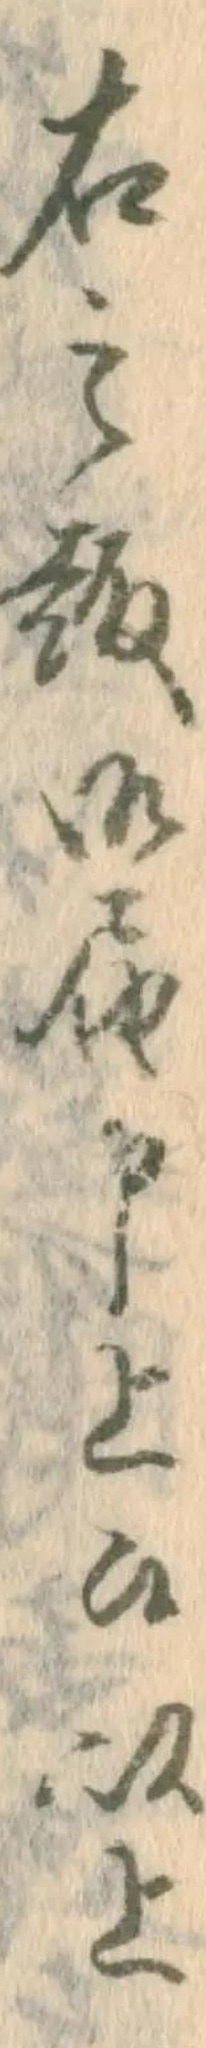右之趣御届申上候以上
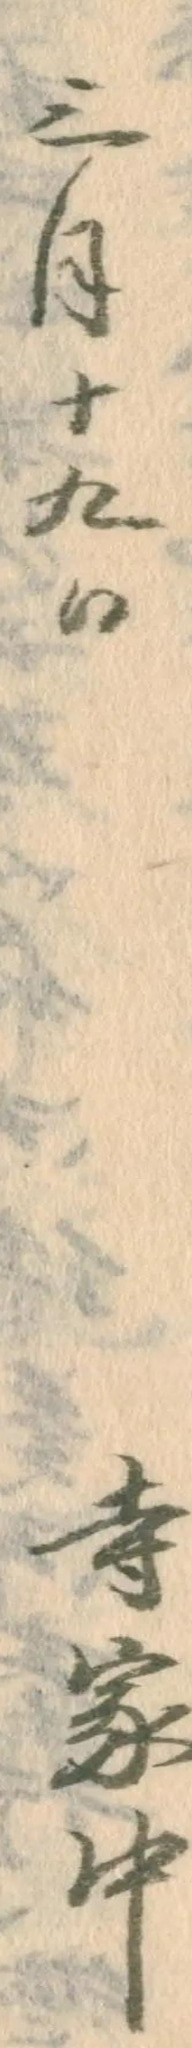三月十九日寺家中
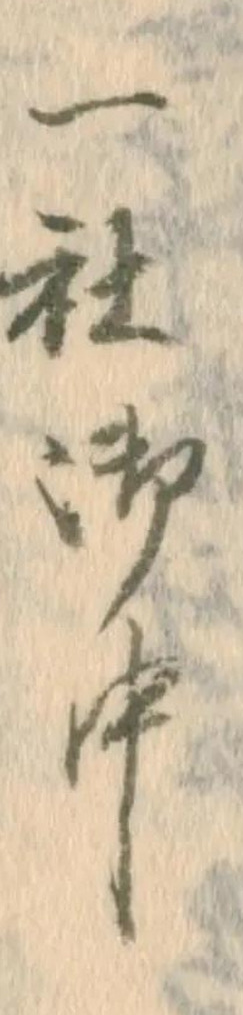一社御中
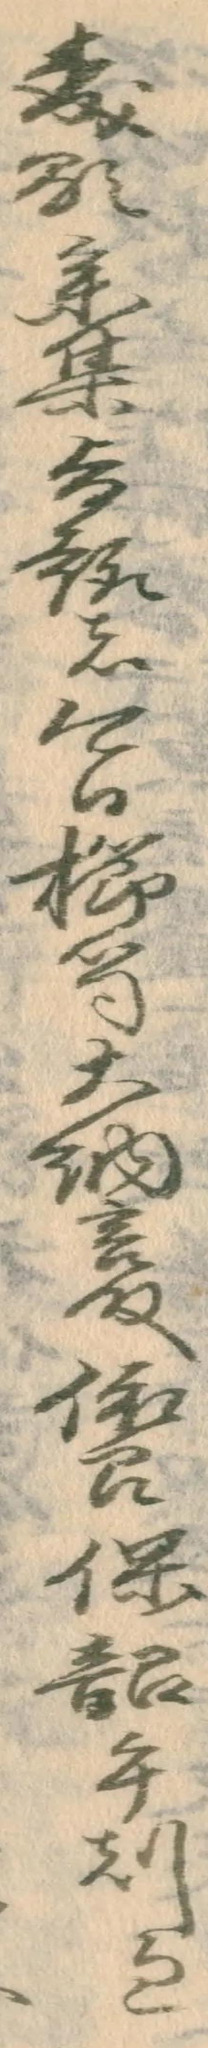森顕参集旨趣は今日櫛笥大納言殿依召保韶午刻過
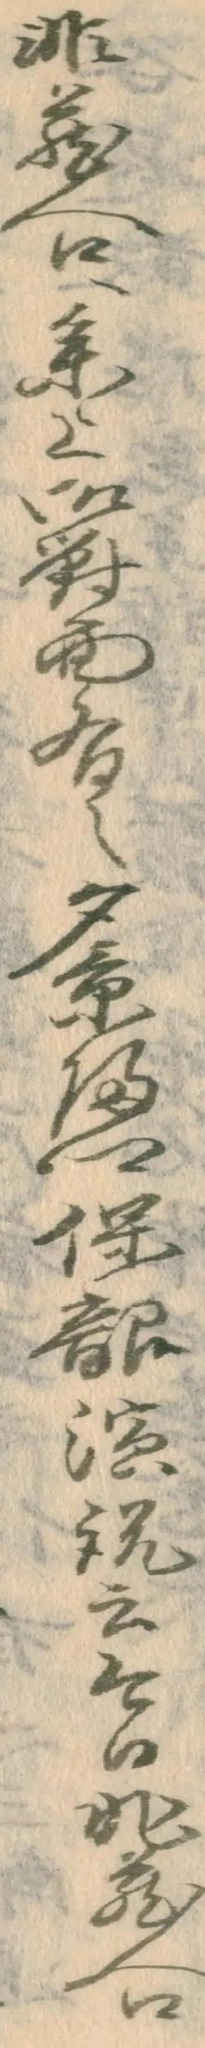非蔵人口へ参上御対面有之夕景帰郷保韶演説云今日非蔵人口
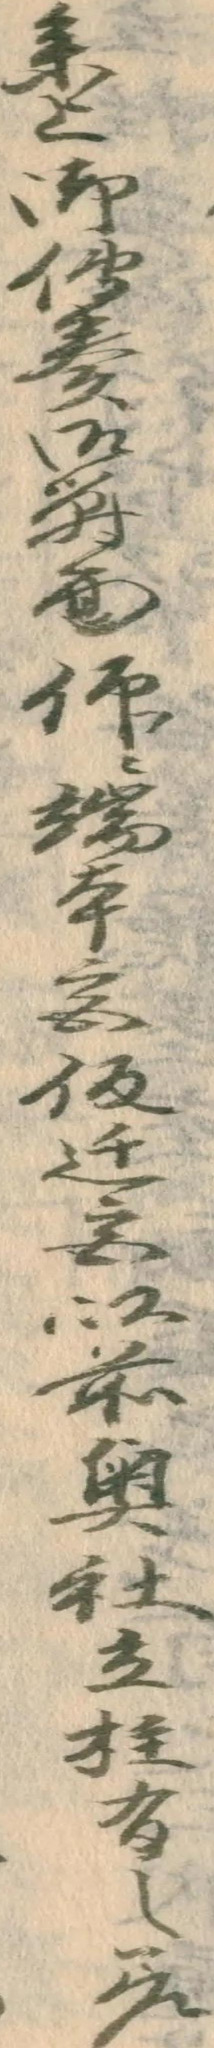参上御伝奏御対面仰ニ端本宮仮迁宮以前奥社立柱有之差
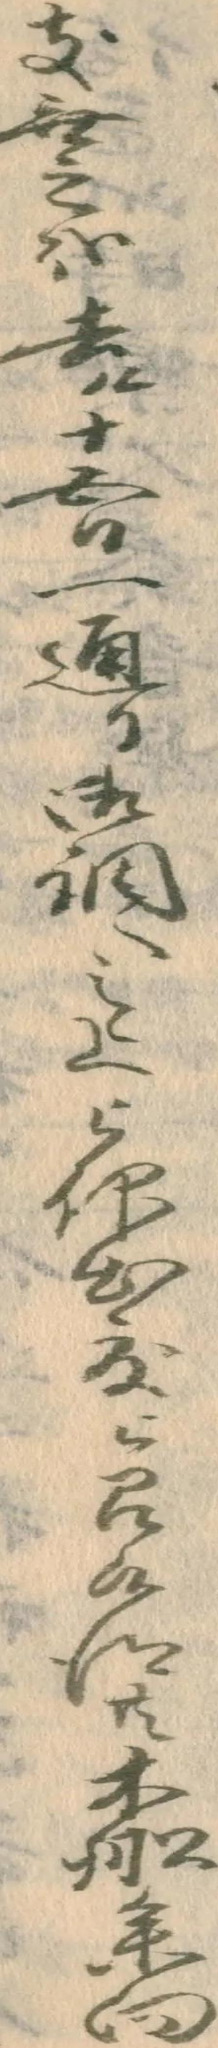支無之哉去ル十五日一通り御調へ之上被仰出度被召候得共木船参向
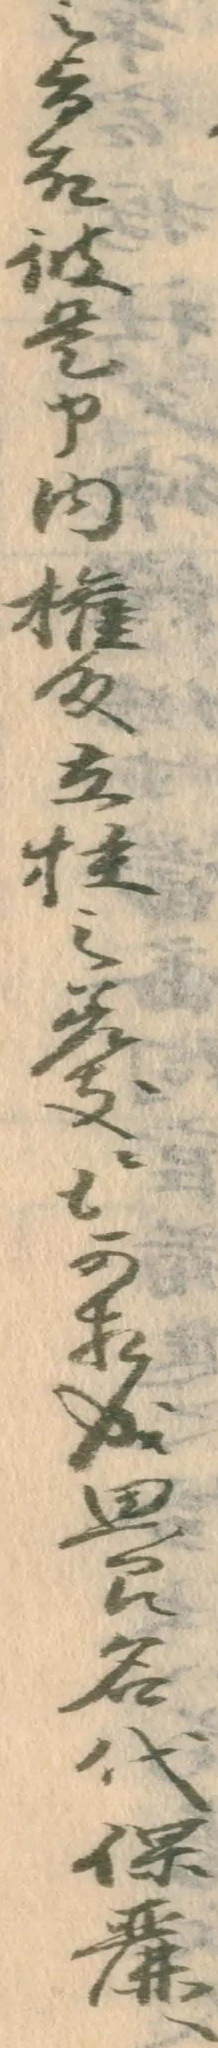之旨故彼是申内権殿立柱之差支ニも可相成思召名代保麗へ
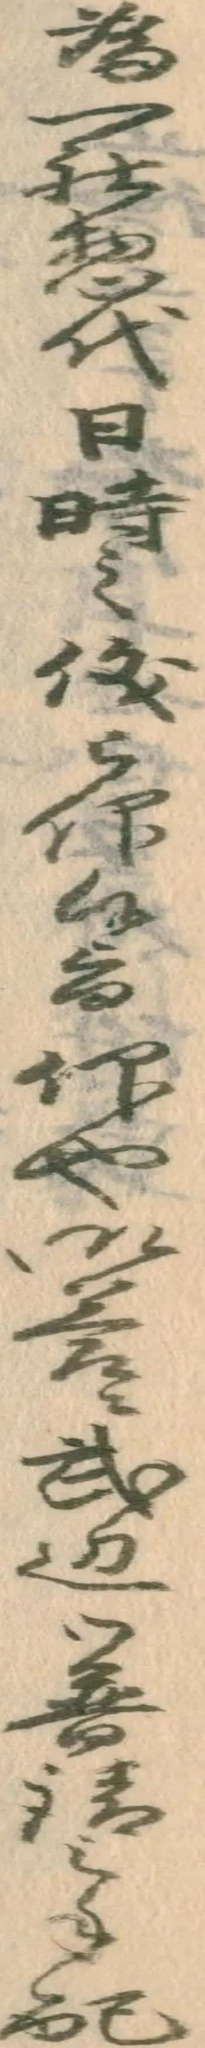為一社惣代日時之儀被仰候旨仰也御答ニ武辺御普請之手配
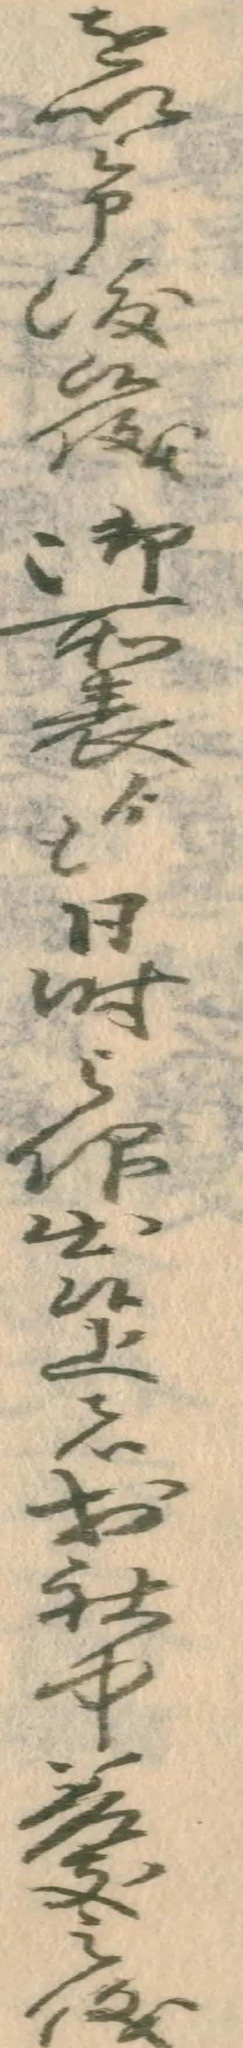を以被申渡候儀御所表ゟも日時被仰出候上は於社中差支之儀
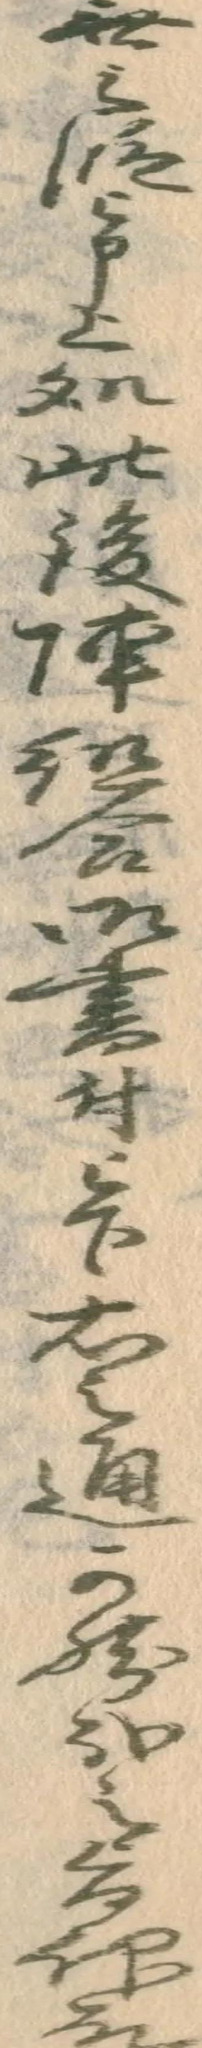無之段被申上処此後陣組合御書付被下右之通可然哉之旨仰故
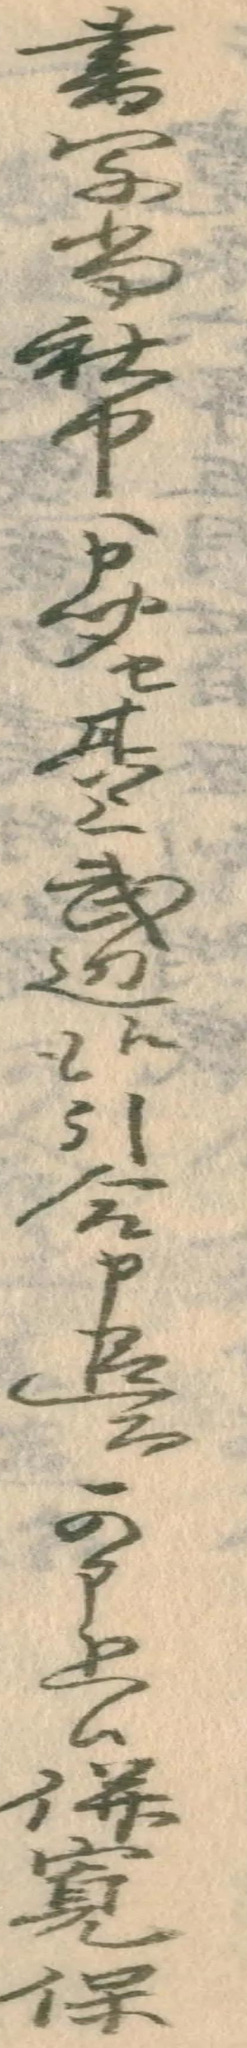書写尚社中へ申聞セ其上武辺江も引合申追而可申上候併寛保
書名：賀茂社記録. 第17冊
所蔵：国立国会図書館 National Diet Library, JAPAN
